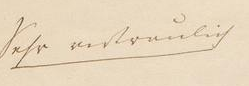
Sehr vertraulich
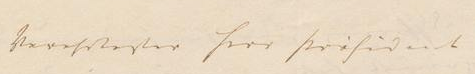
Verehrtester Herr Präsident
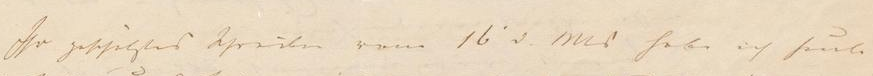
Ihr geschätztes Schreiben vom 16t d. Mts habe ich heute
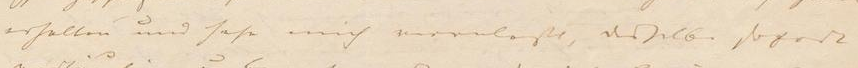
erhalten und sehe mich veranlaßt, dasselbe sofort
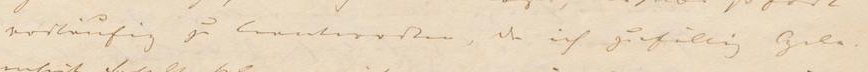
vorläufig zu beantworten, da ich zufällig Gele-
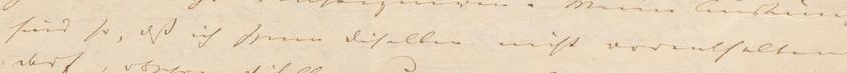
sind so, daß ich Ihnen dieselben nicht vorenthalten
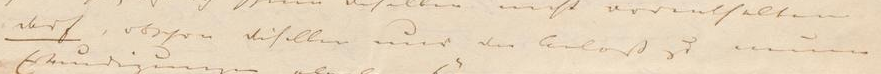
darf, obschon dieselben nur den Anlaß zu meinen
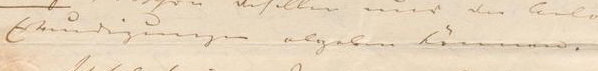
Erkundigungen abgeben können.
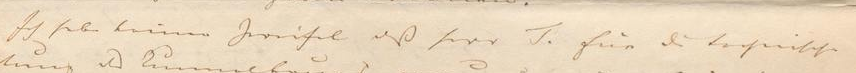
Ich habe keinen Zweifel daß Herr T. für die technische
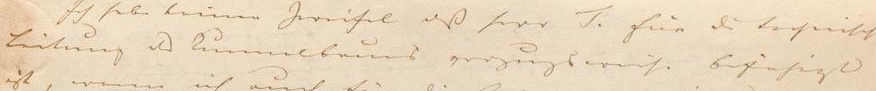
Leitung des Tunnelbaues vorzugsweise befähigt
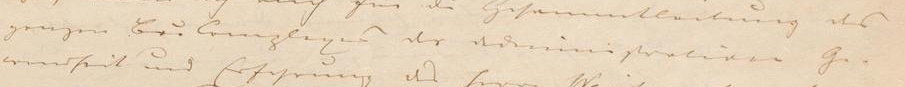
ganzen Bau Complexes der administrativen Ge-
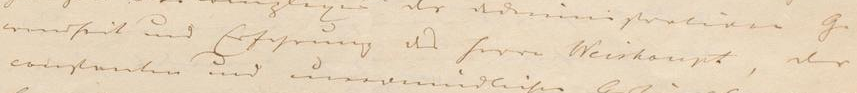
wandheit und Erfahrung des Herrn Weishaupt, der
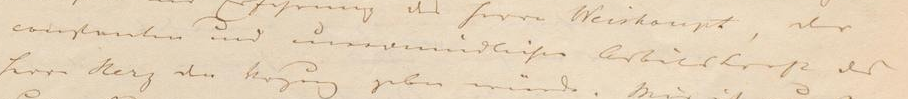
constanten und unermüdlichen Antriebskraft des
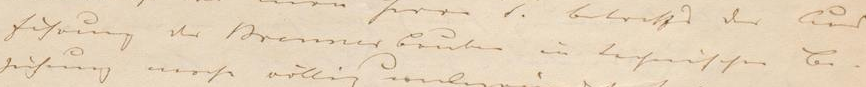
führung der Brenner bauten in technischer Be-
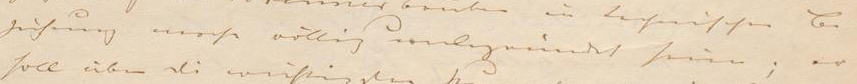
ziehung mache völlig unbegründet seien; er
